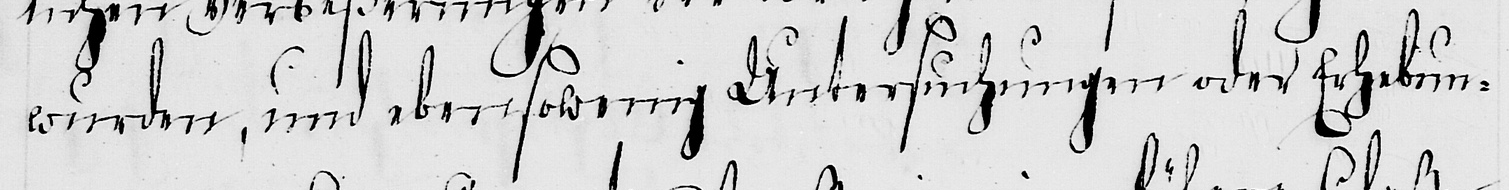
wurden, und ebensowenig Untersuchungen oder Erhebun¬
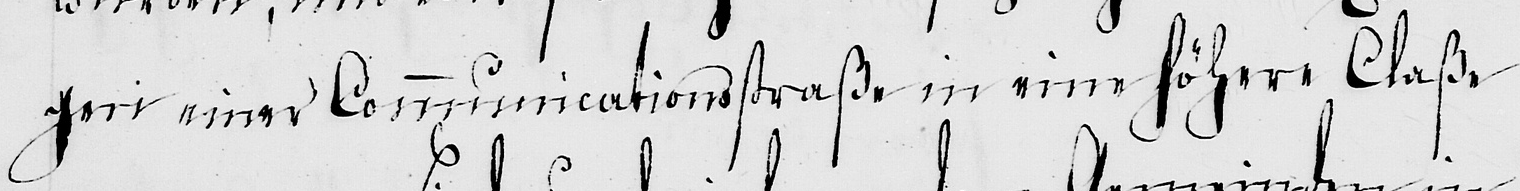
gen einer Communicationsstraße in eine höhere Claße
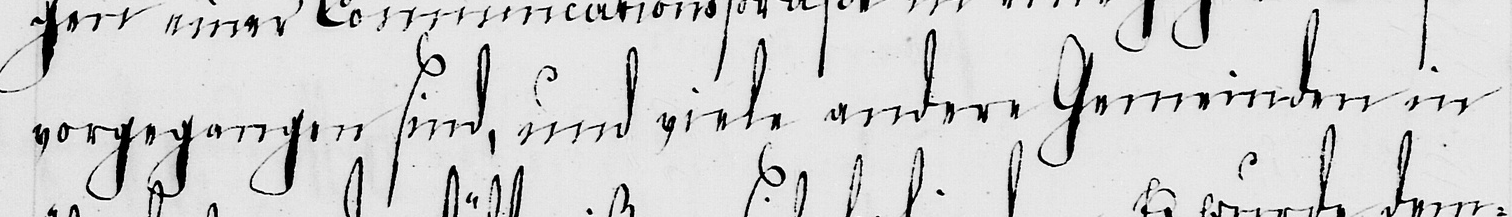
vorgegangen sind, und viele andere Gemeinden in
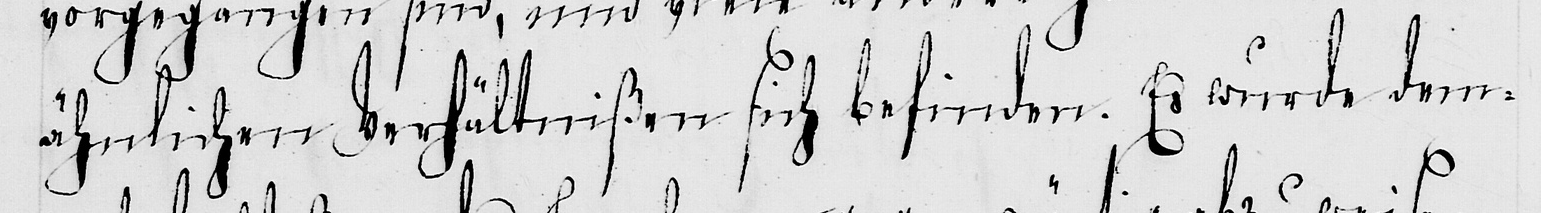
ähnlichen Verhältnißen sich befinden. Es wurde dem¬
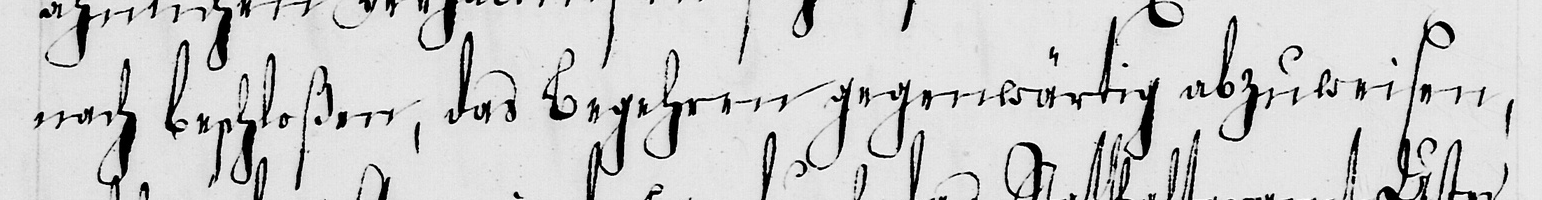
nach beschloßen, das Begehren gegenwärtig abzuweisen,
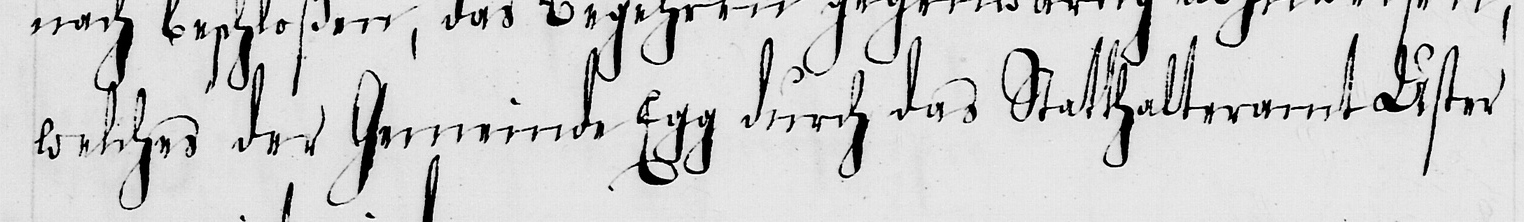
welches der Gemeinde Egg durch das Statthalteramt Uster
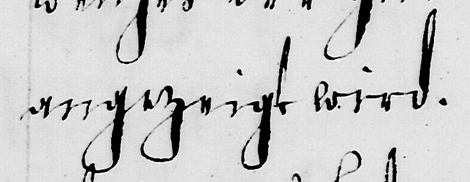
angezeigt wird.
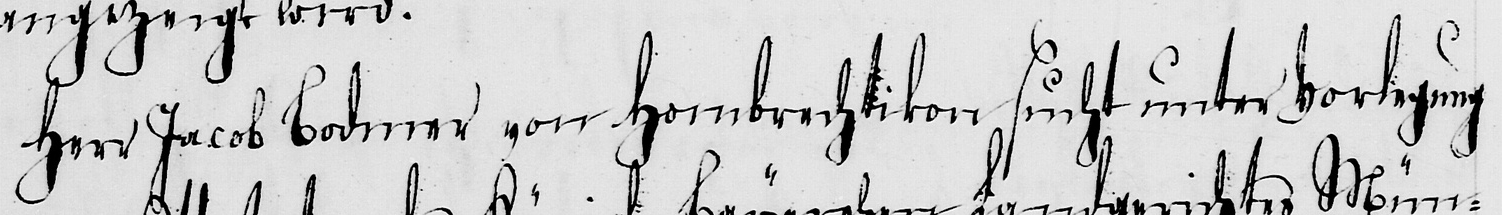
Herr Jacob Bodmer von Hombrechtikon sucht unter Vorlegung
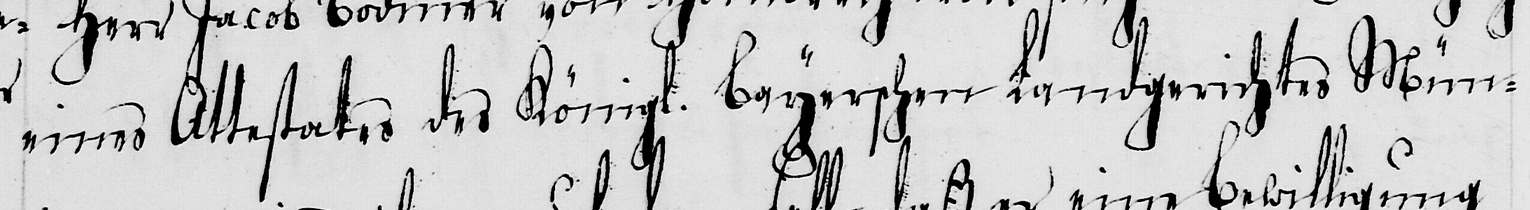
eines Attestates des Königl. Bayerschen Landrichters Mün¬
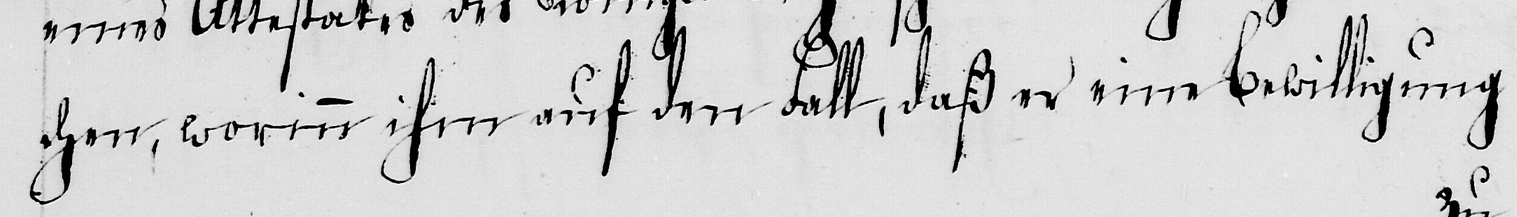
chen, worin ihm auf den Fall, daß er eine Bewilligung
